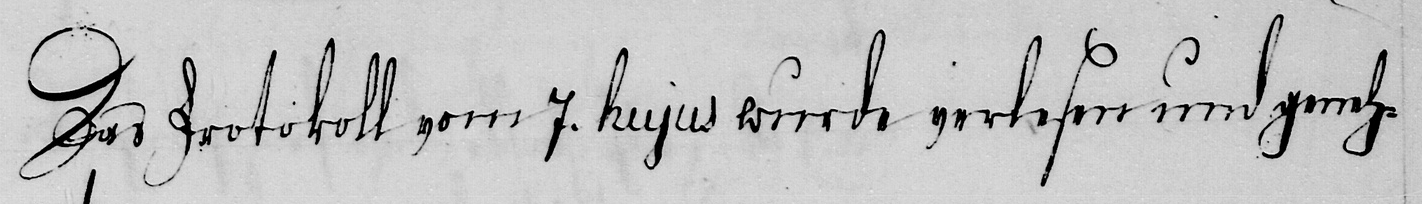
Das Protokoll vom 7. hujus wurde verlesen und geneh¬
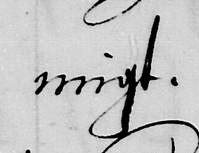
migt.
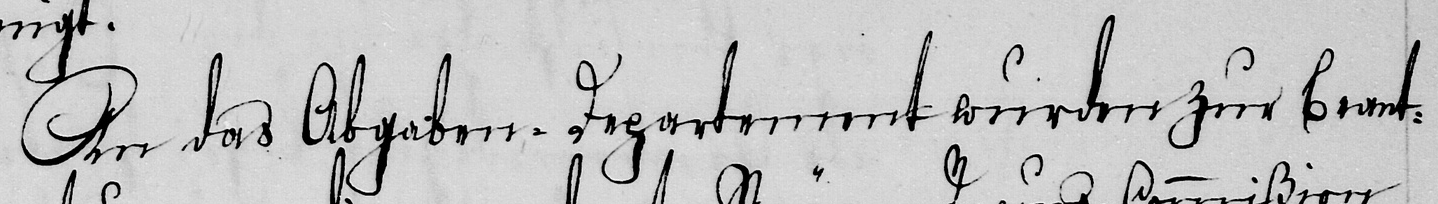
An das Abgaben-Departement wurden zur Beant¬
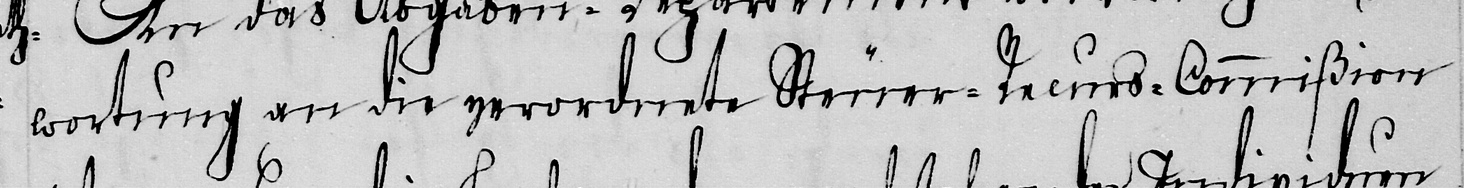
wortung an die verordnete Steuer-Recurs-Commißion
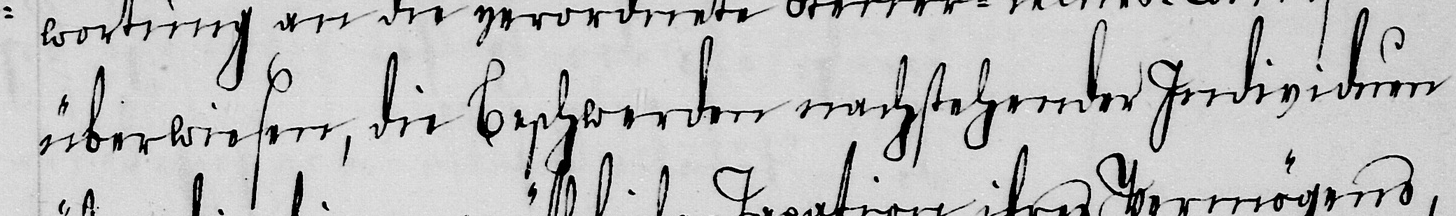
überwiesen, die Beschwerden nachstehender Individuen
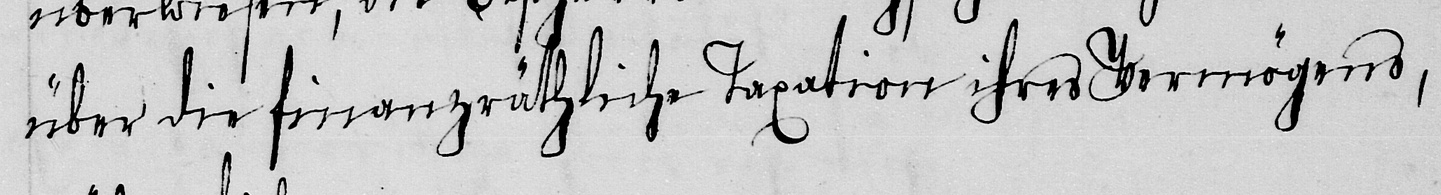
über die finanzräthliche Taxation ihres Vermögens,
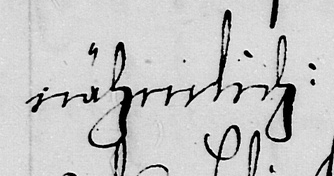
nähmlich:
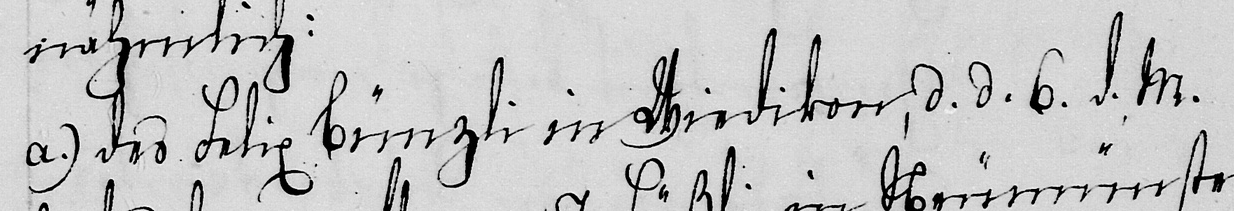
a.) des Felix Bünzli in Wiedikon, d. d. 6. d. M.
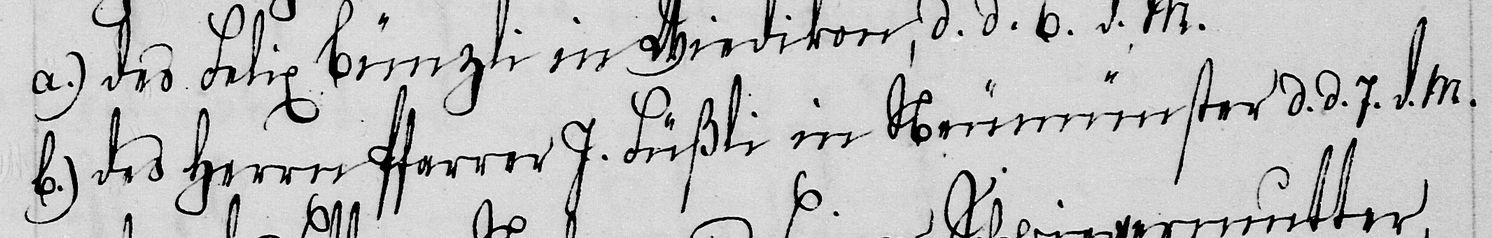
b.) des Herrn Pfarrer J. Füßli in Neumünster d. d. 7.
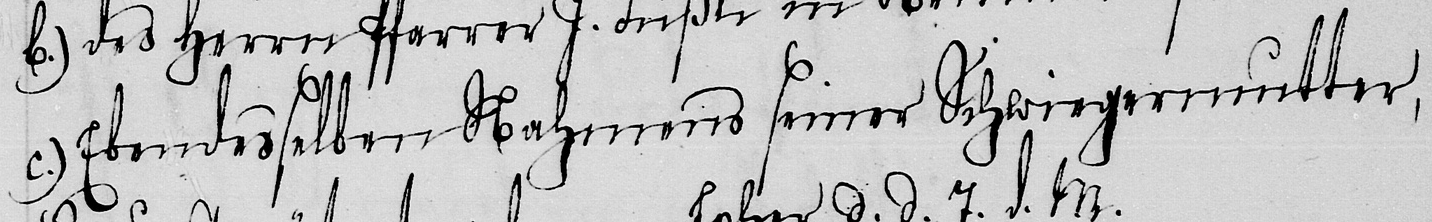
Ebendesselben Nahmens seiner Schwiegermutter,
